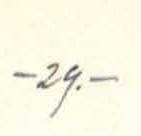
24.
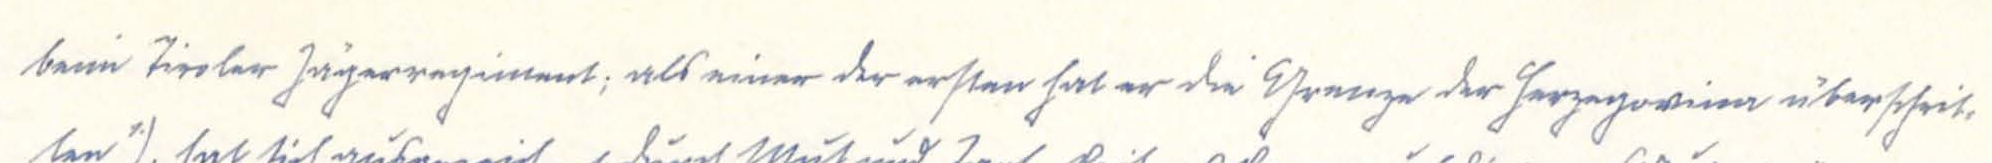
beim Tiroler Jägerregiment; als einer der ersten hat er die Grenze der Herzegovina überschrit-
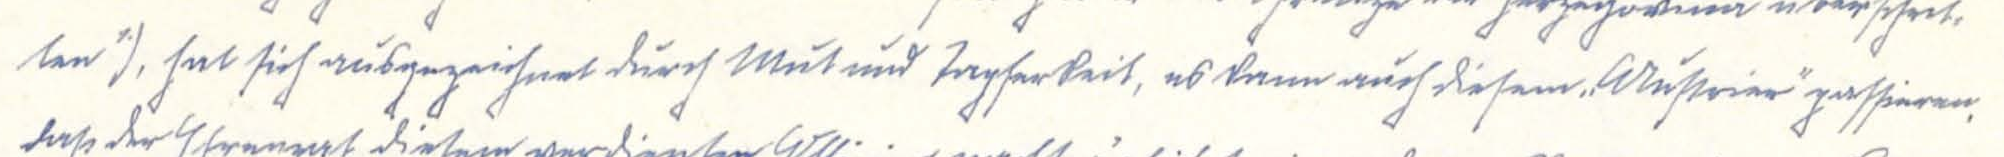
ten 1.), hat sich ausgezeichnet durch Mut und Tapferkeit, es kann auch diesem „Austrier" passieren,
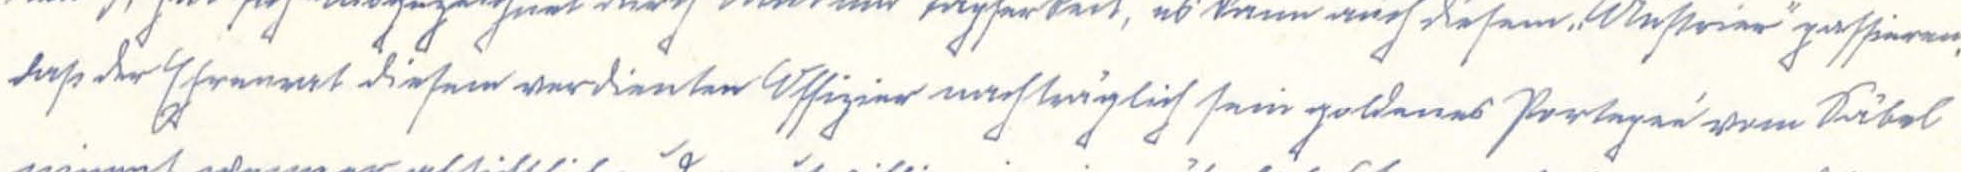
dass der Ehrenrat diesem verdienten Offizier nachträglich sein goldenes Portepée vom Säbel
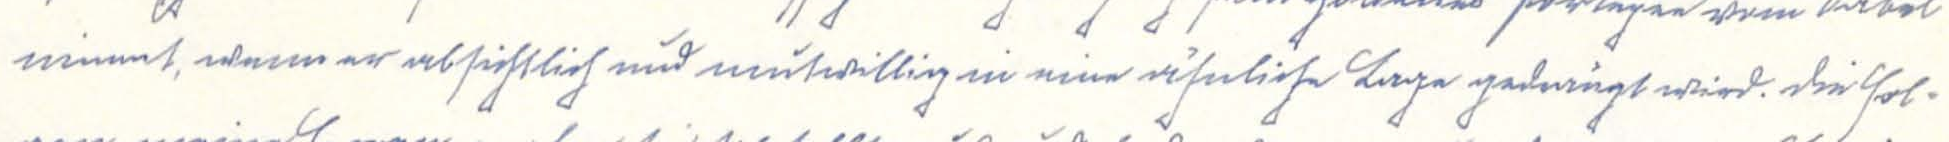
nimmt, wenn er absichtlich und mutwillig in eine ähnliche Lage gedrängt wird. Die Fol-
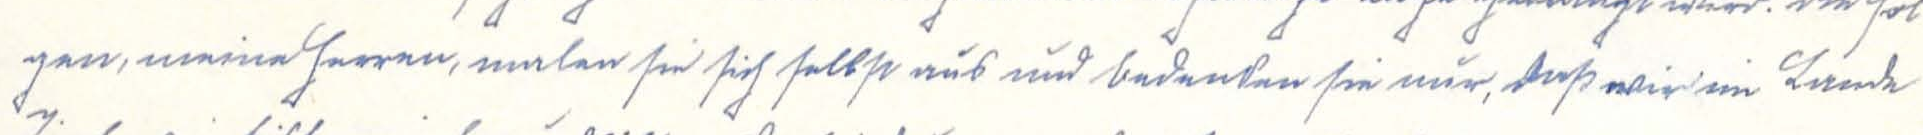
gen, meine Herren, malen sie sich selbst aus und bedenken sie nur, daß wir im Lande
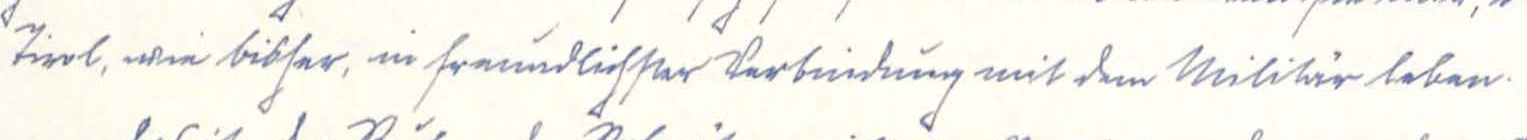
Tirol, wie bisher, in freundlichster Verbindung mit dem Militär leben.
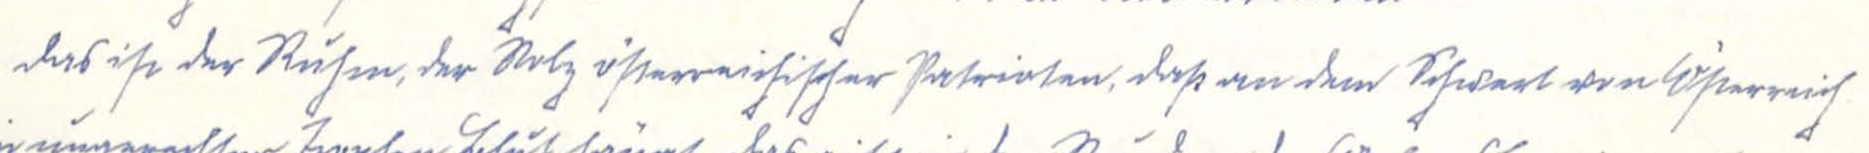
das ist der Ruhm, der Stolz österreichischer Patrioten, daß an dem Schwert von Österreich
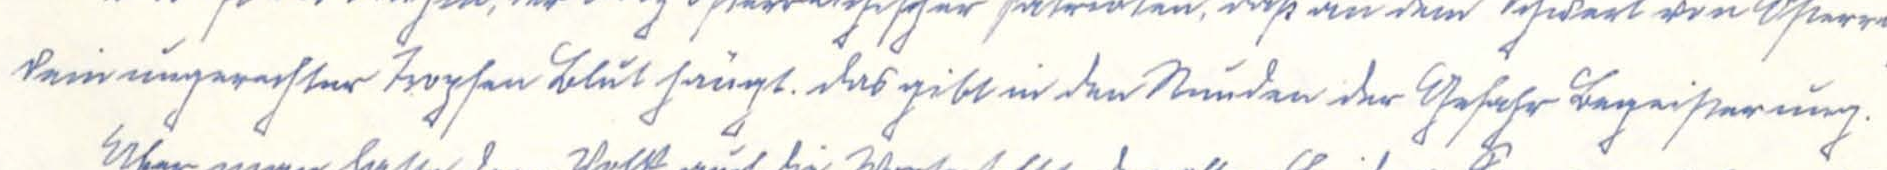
kein ungerechter Tropfen Blut hängt. Das gibt in den Stunden der Gefahr Begeisterung.
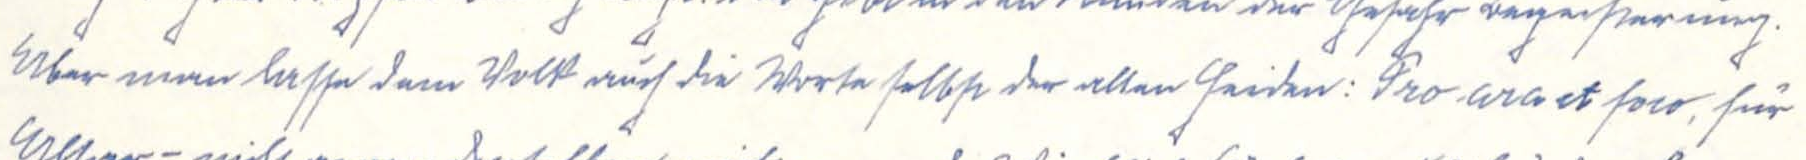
Aber man lasse dem Volk auch die Worte selbst der alten Griechen: Pro ara et foco, für
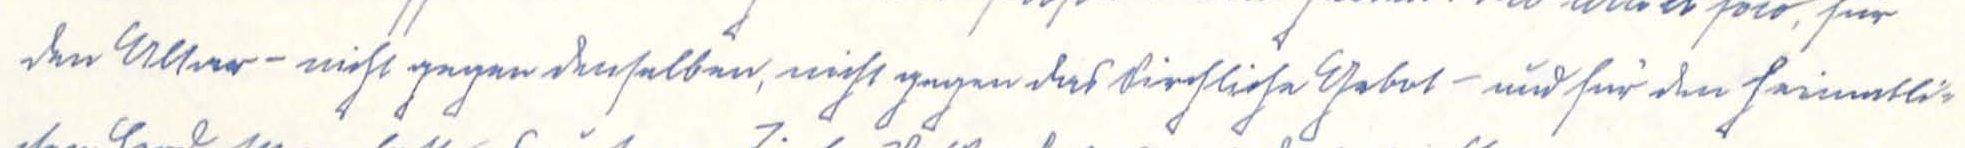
den Altar - nicht gegen denselben, nicht gegen das kirchliche Gebot - und für den heimatli-
